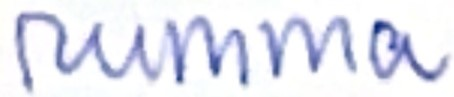питта
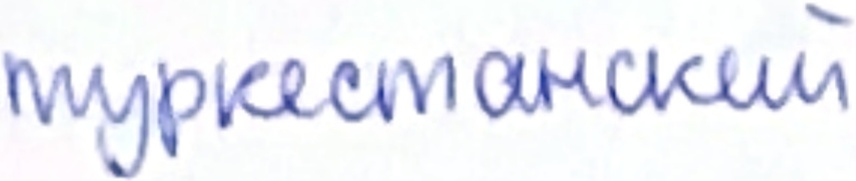туркестанский
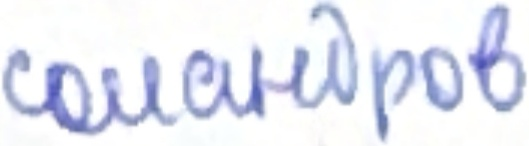соландров
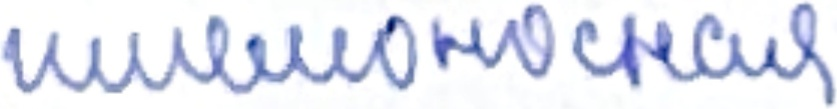шлемоносная
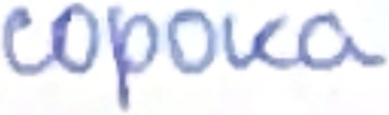сорока
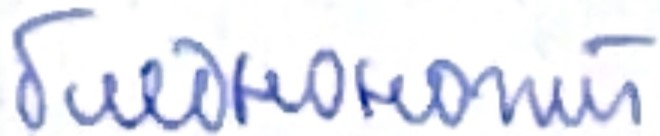бледноногий
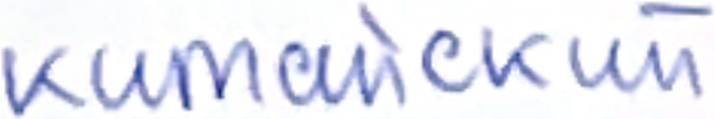китайский
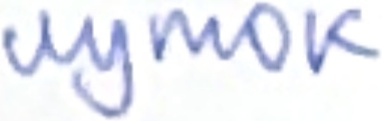луток
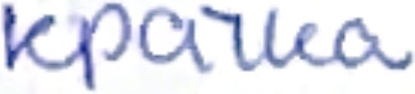крачка
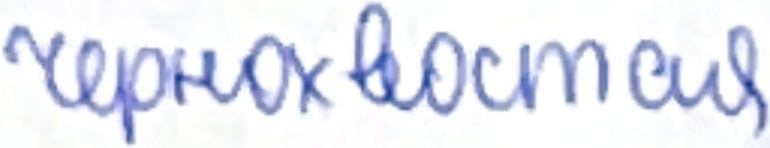чернохвостая
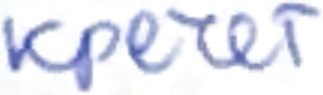кречет
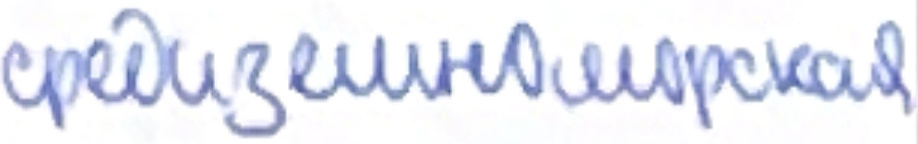средиземноморская
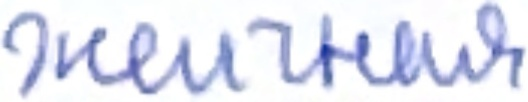желчная
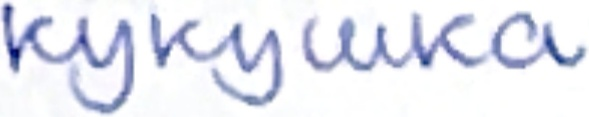кукушка
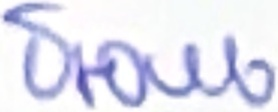бюль
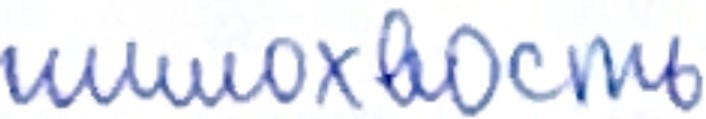шилохвость
